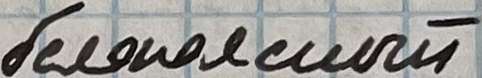белопоясный
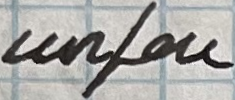нырок
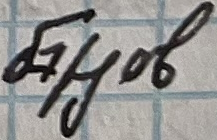бэрдов
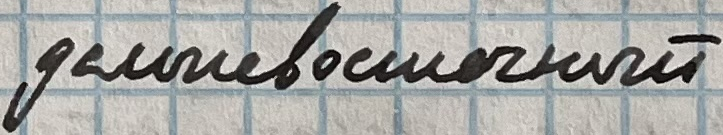дальневосточный
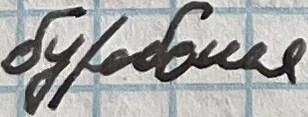буробокая
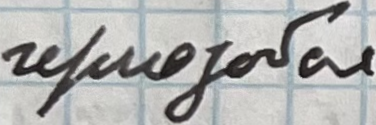чернозобая
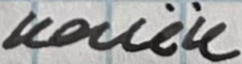конёк
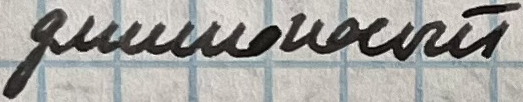длинноносый
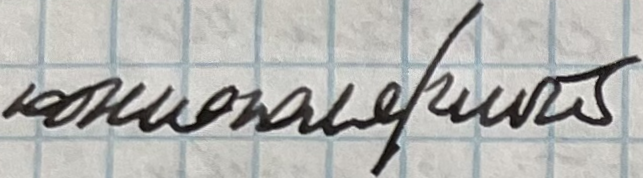южнополярный
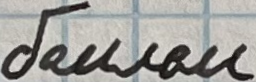баклан
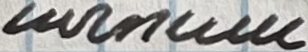пыжик
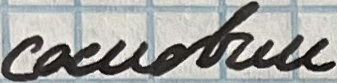сосновик
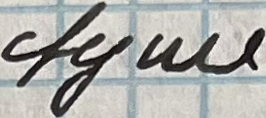средняя
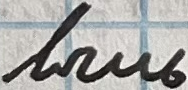выпь
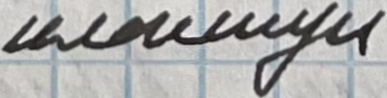клоктун
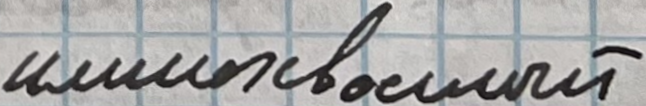клинохвостый
